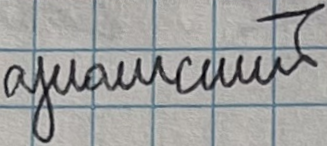азиатский
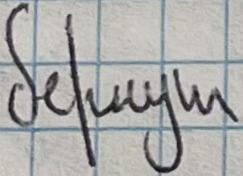беркут
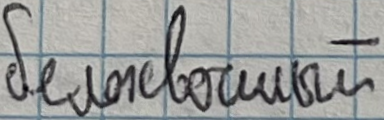белохвостый
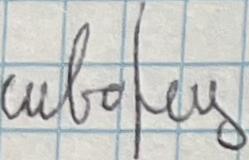скворец
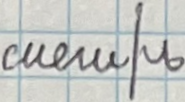снегирь
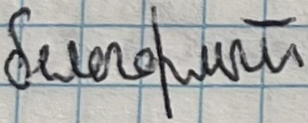белогорлый
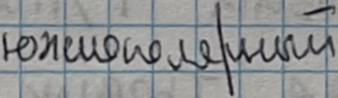южнополярный
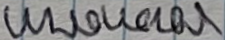иглоногая
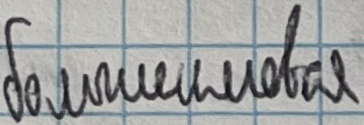большеклювая
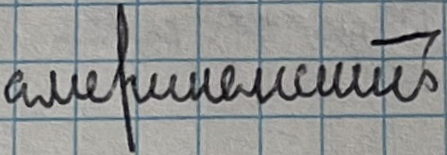америнанский
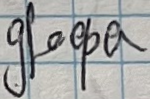дрофа
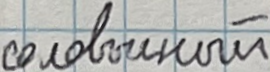соловьиный
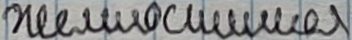желтоспинная
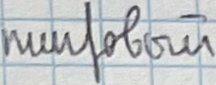тигровый
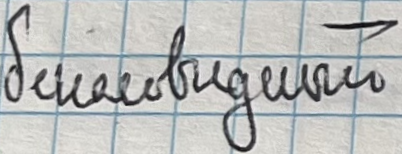бекасовидный
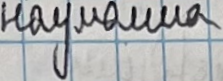науманна
